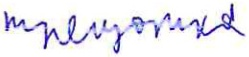трецотка
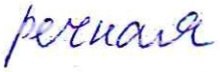речная
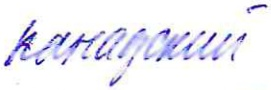канадский
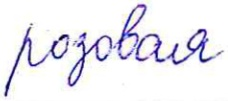розовая
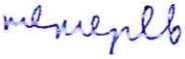тетерев
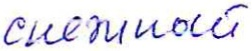снежный
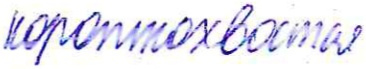короткохвостая
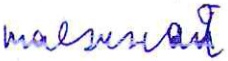таежная
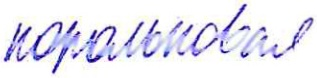корольковая
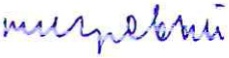тигровый
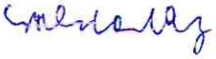стенолаз
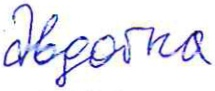авдотка
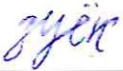зуёк
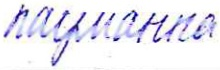науманна
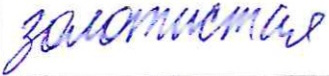золотистая
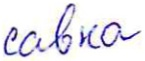савка
